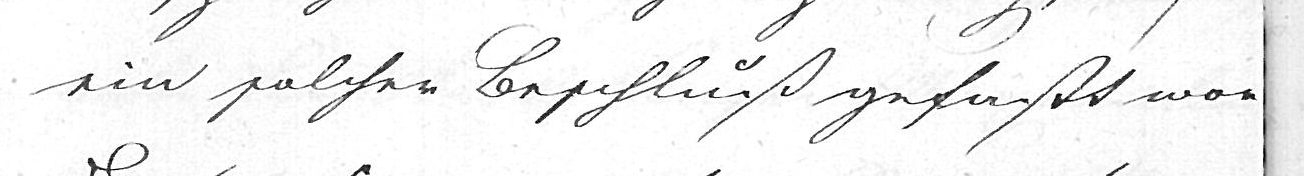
ein solcher Beschluß gefaßt wor-
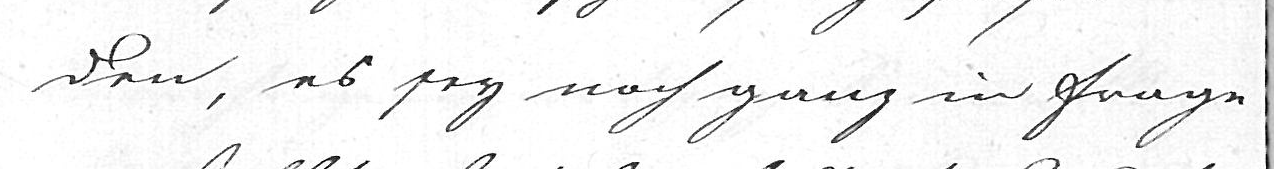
den, es sey noch ganz in Frage
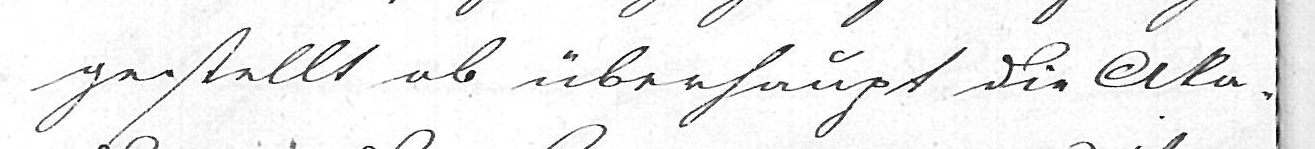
gestellt ob überhaupt die Aka-
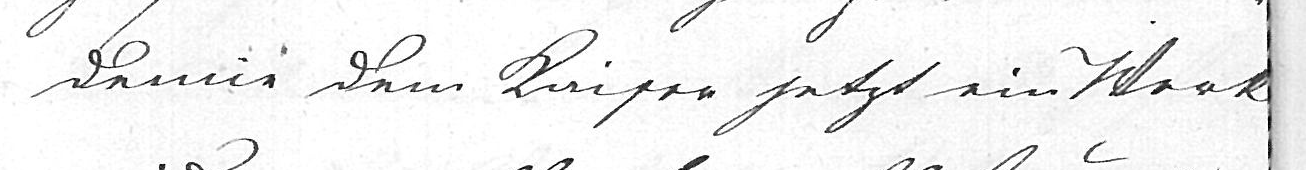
demie dem Kaiser jetzt ein Werk
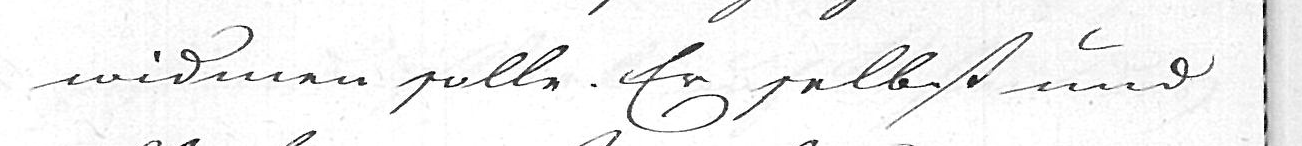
widmen solle. Er selbst und
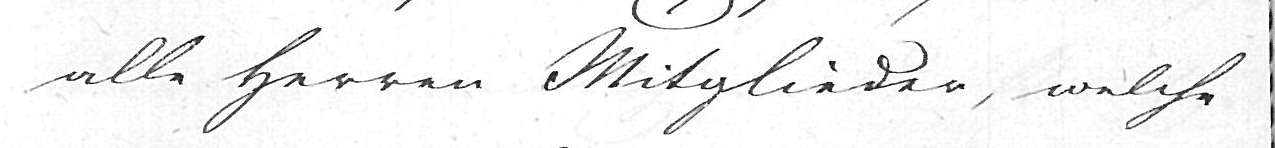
alle Herren Mitglieder, welche
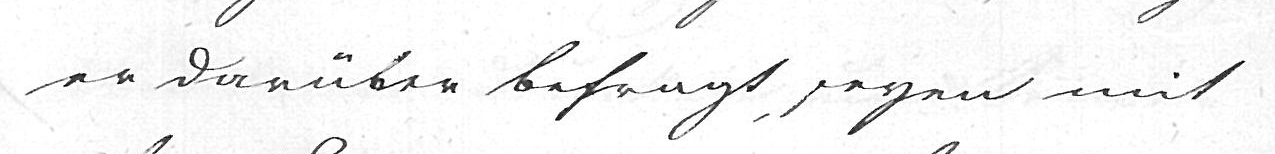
er darüber befragt, seyen mit
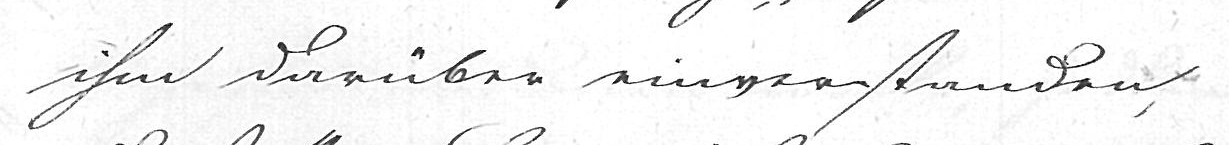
ihm darüber einverstanden,
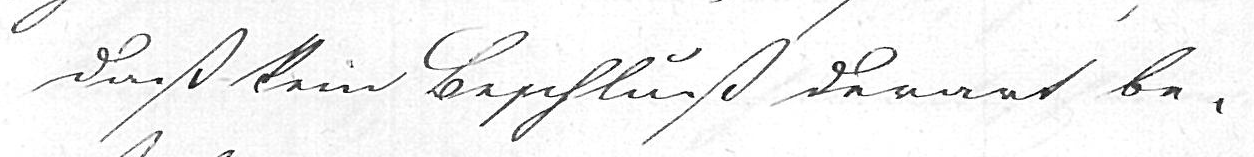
daß kein Beschluß derart be-
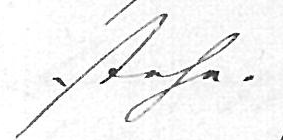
stehe.
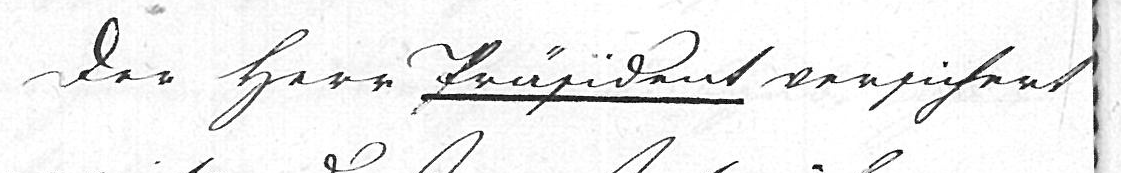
Der Herr Präsident versichert
